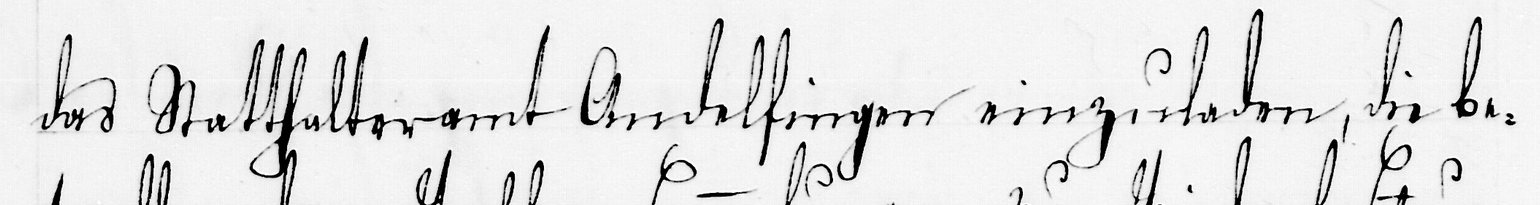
das Statthalteramt Andelfingen einzuladen, die be¬
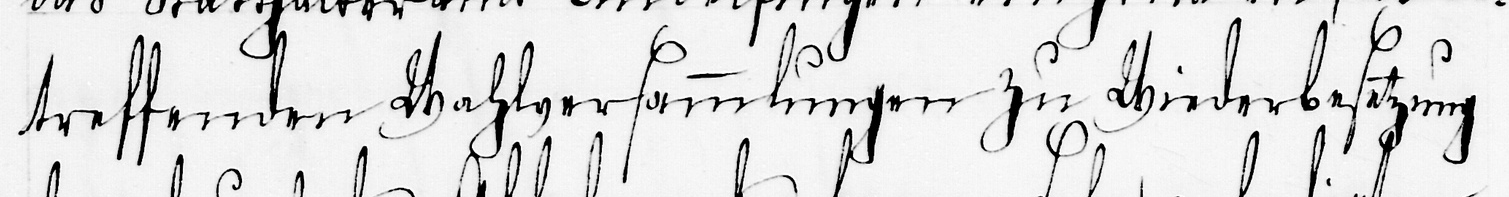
treffenden Wahlversammlungen zu Wiederbesetzung
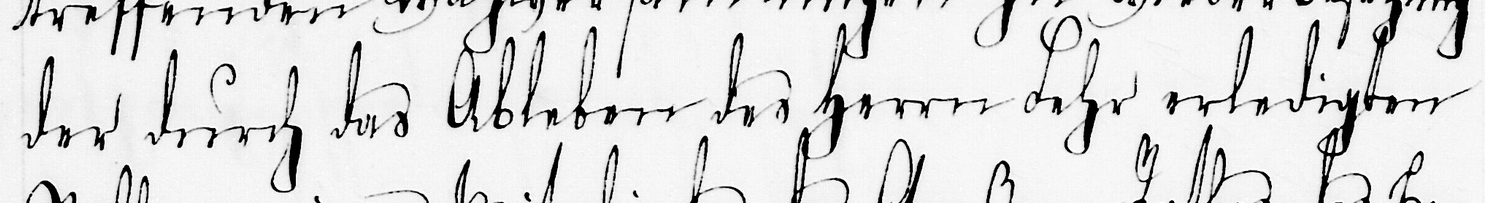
der durch das Ableben des Herrn Fehr erledigten
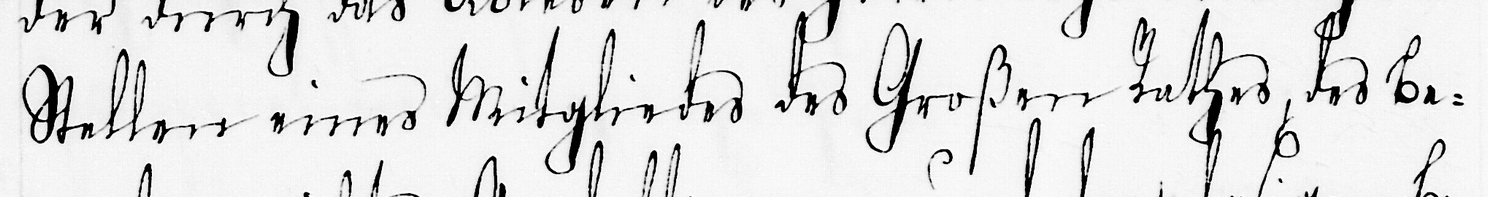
Stellen eines Mitgliedes des Großen Rathes des Be¬
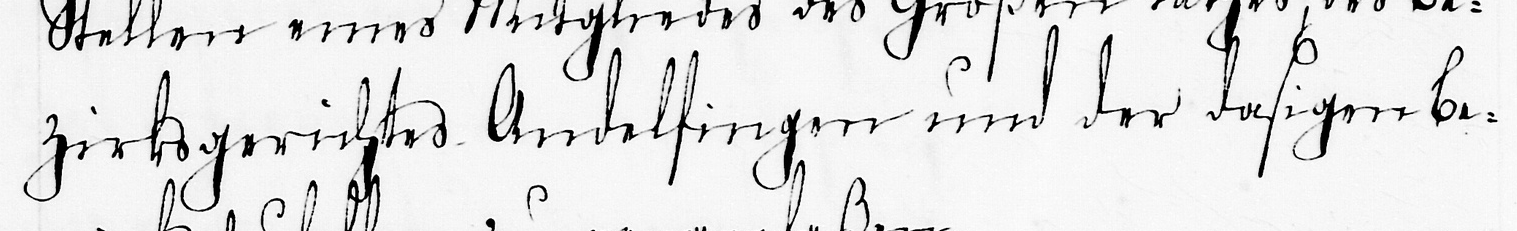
zirksgerichtes Andelfingen und der dasigen Be¬
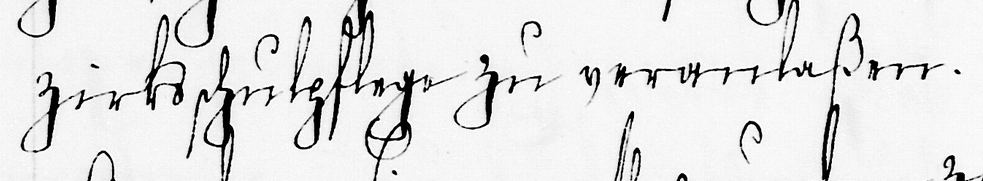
zirksschulpflege zu veranlaßen.
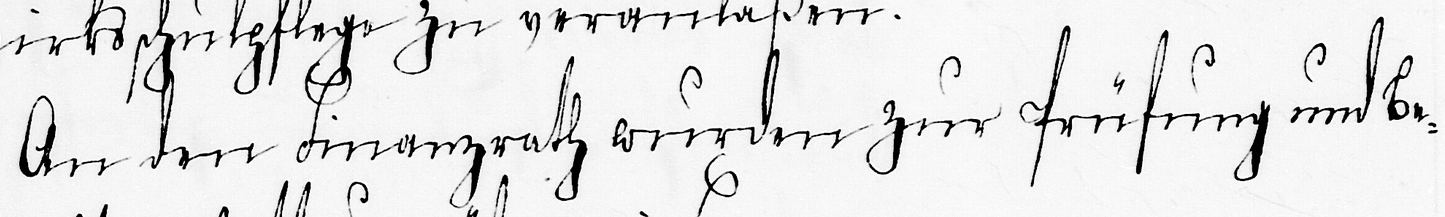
An den Finanzrath wurden zur Prüfung und Be¬
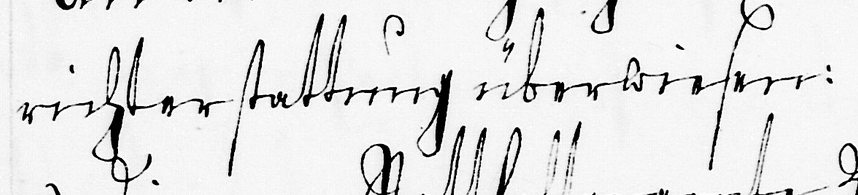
richterstattung überwiesen:
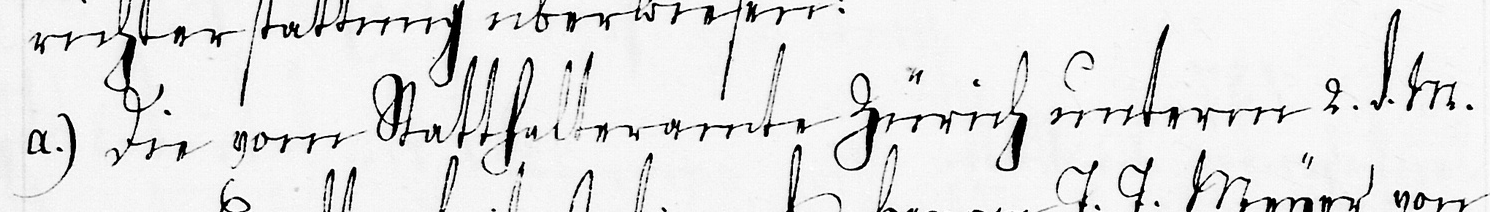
a.) Die vom Statthalteramte Zürich unterm 2. d. M.
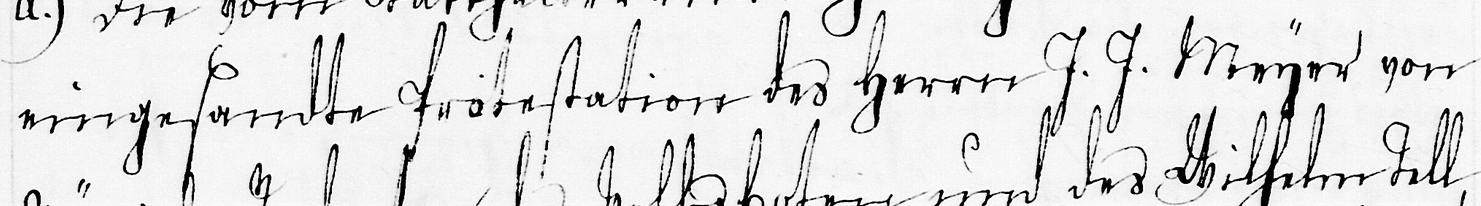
eingesandte Protestation des Herrn J. J. Meyer von
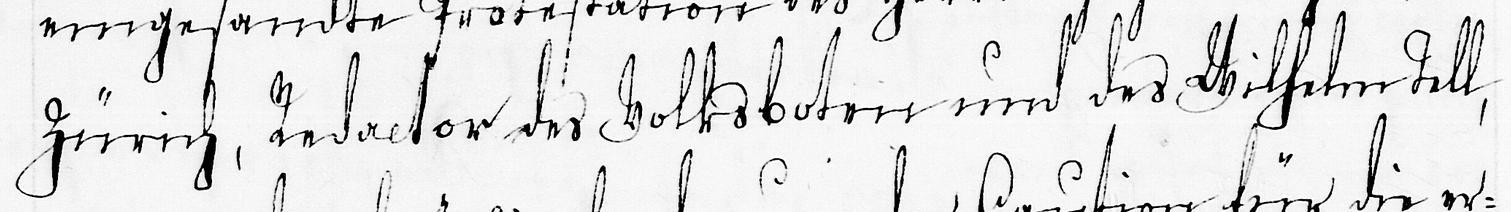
Zürich, Redactor des Volksboten und des Wilhelm Tel¬
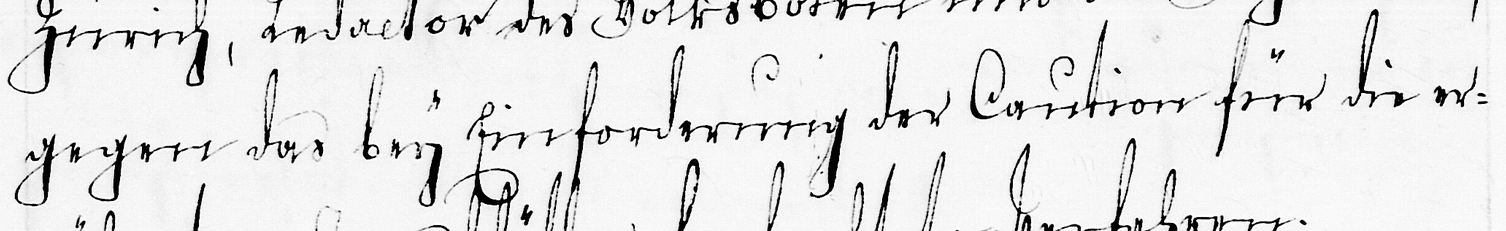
gegen das bey Einforderung der Caution für die er¬
